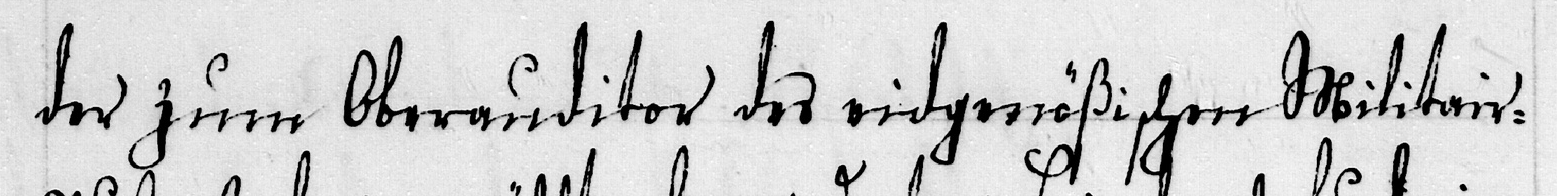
der zum Oberauditor des eidgenößischen Militai¬
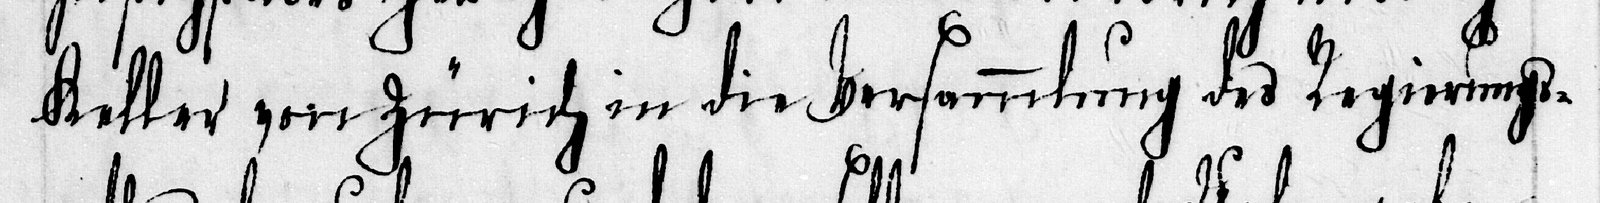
Keller von Zürich in die Versammlung des Regierungs¬
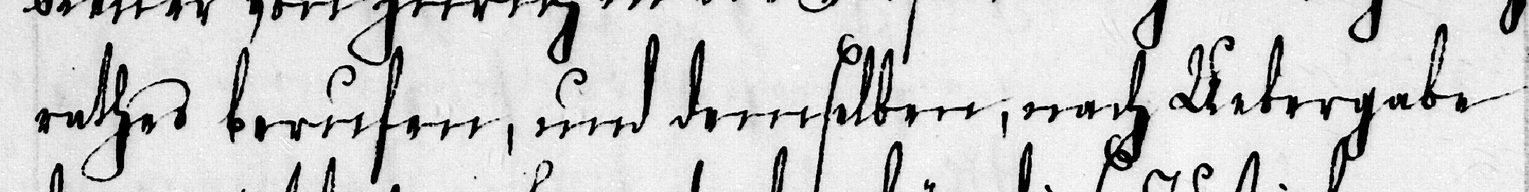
rathes berufen, und demselben, nach Uebergabe
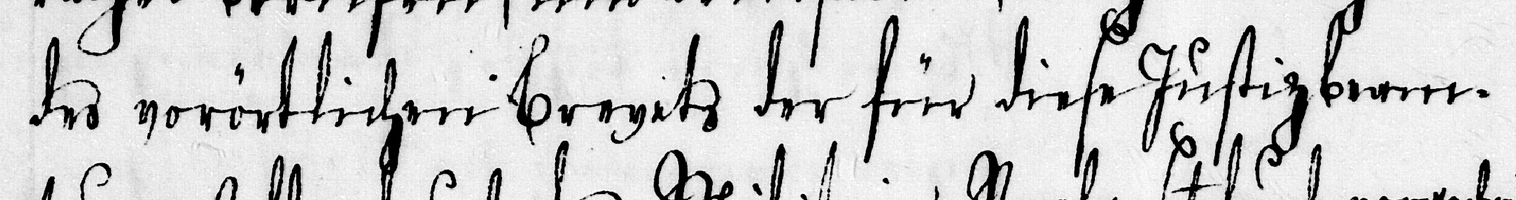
des vorörtlichen Brevets der für diese Justizbeam¬
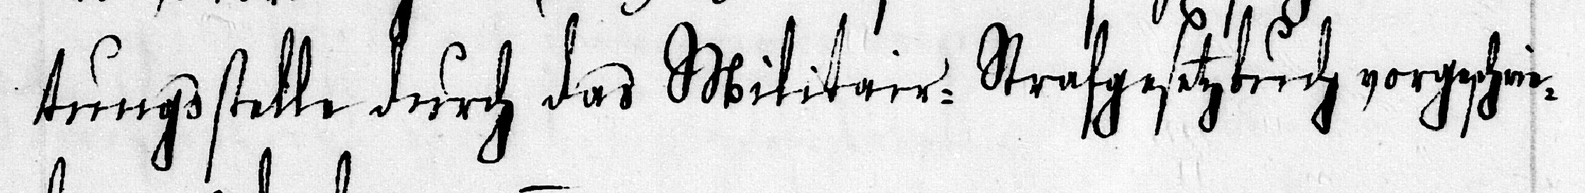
tungsstelle durch das Militair-Strafgesetzbuch vorgeschri¬
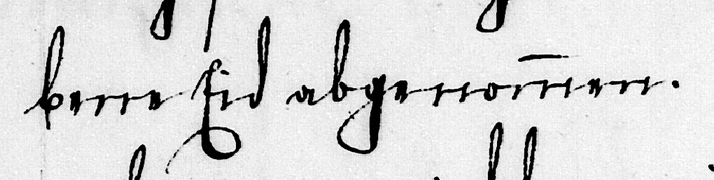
ebene Eid abgenommen.
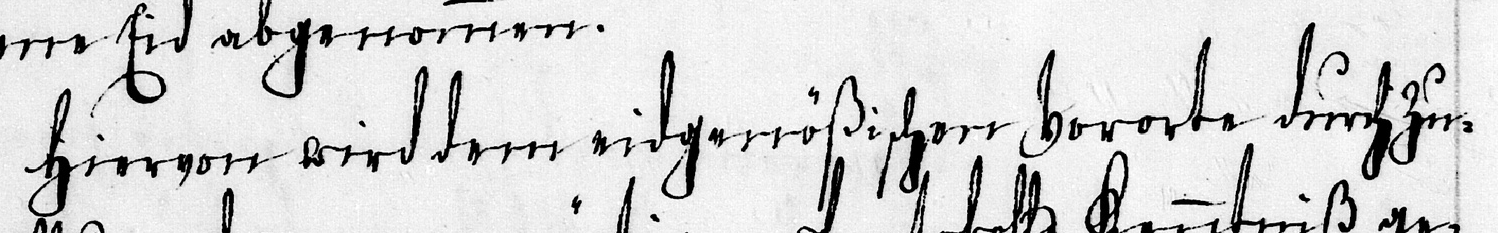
Hiervon wird dem eidgenößischen Vororte durch Zu¬
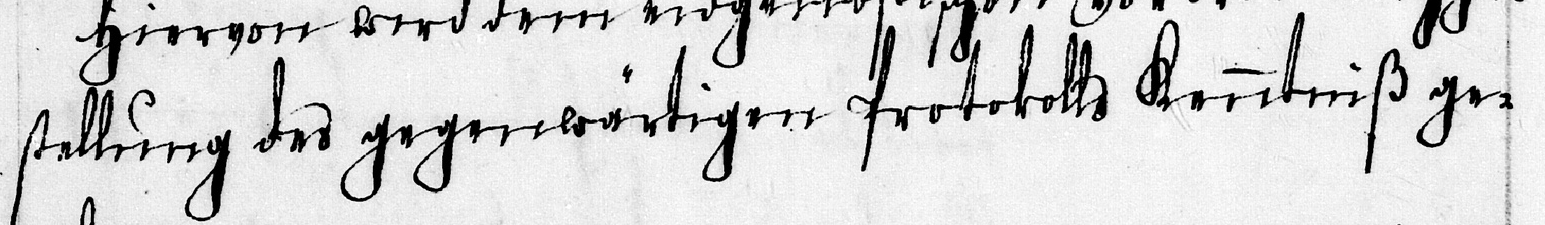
stellung des gegenwärtigen Protokolls Kenntniß ge¬
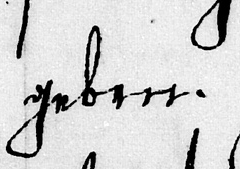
geben.
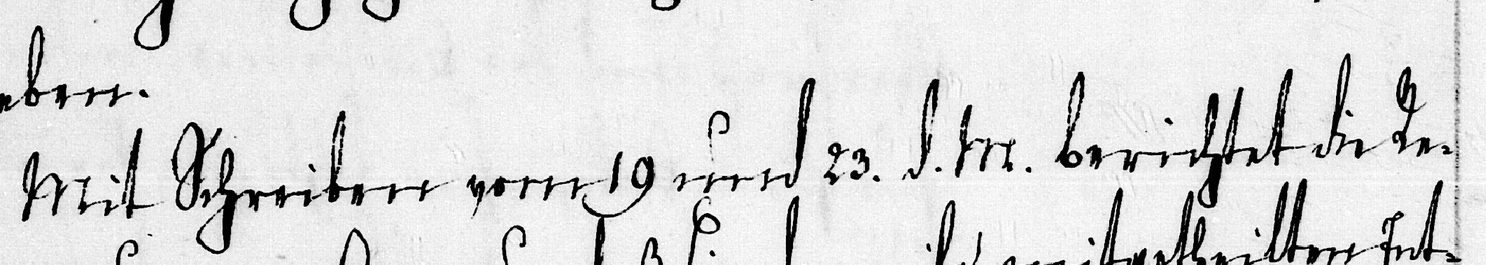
Mit Schreiben vom 19 und 23. d. M. berichtet die Re¬
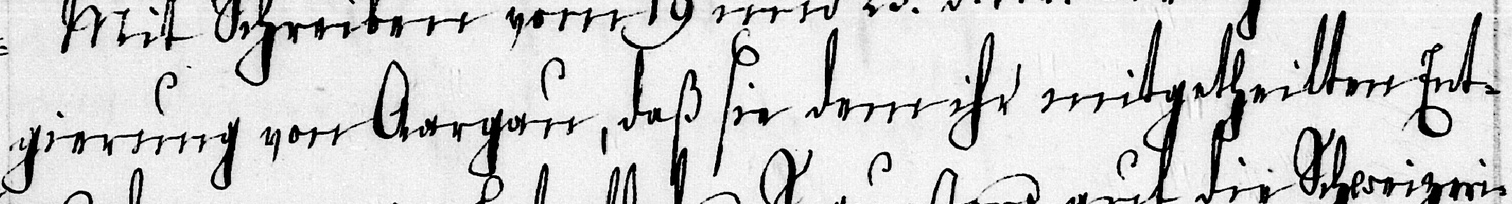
gierung von Aargau, daß die dem ihr mitgetheilten Ent¬
